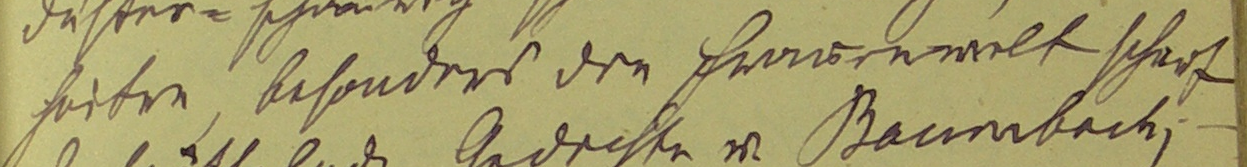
heiter, besonders die Frauenwelt scharf
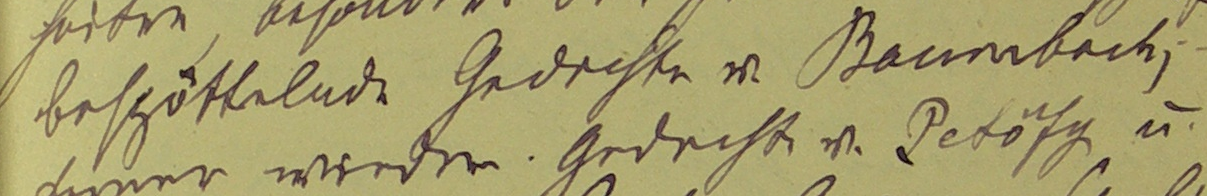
bespöttelnde Gedichte von Baumbach;--
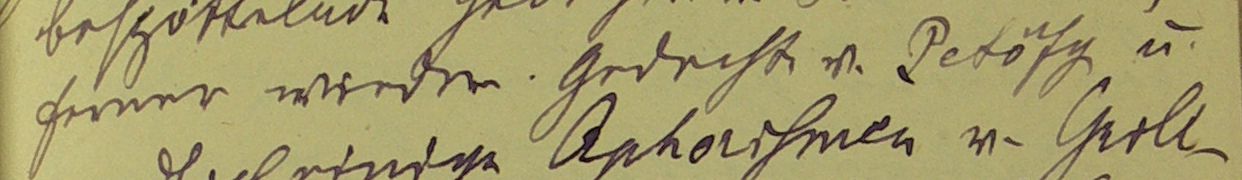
ferner wieder Gedichte von Petöfy und
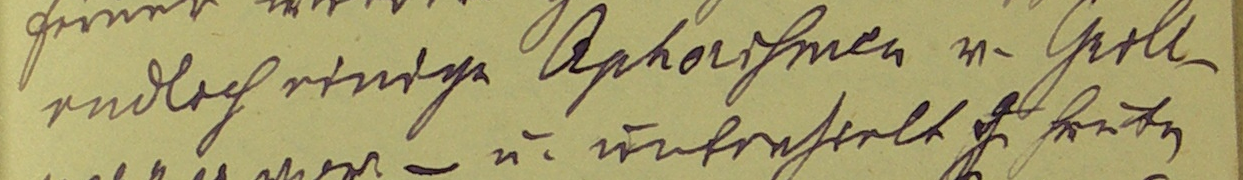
endlich einige Aphorismen von Grill¬
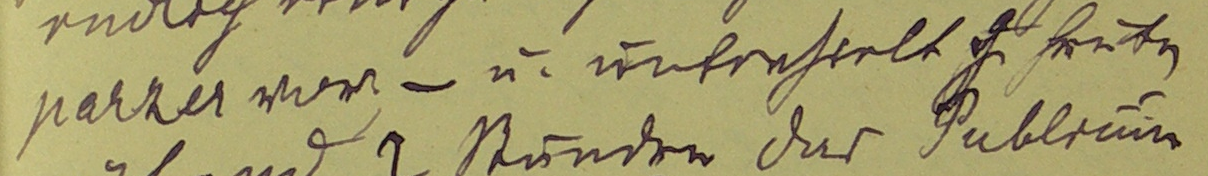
parzer vor, und unterhielt auch heute
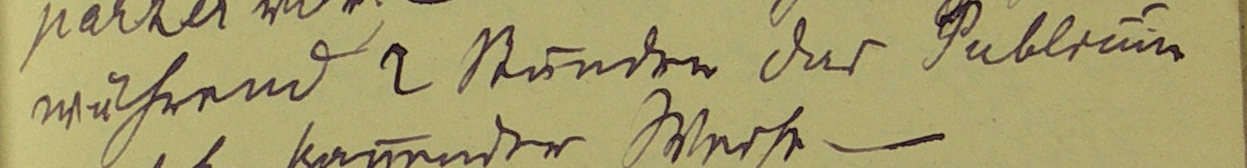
während 2 Stunden das Publikum
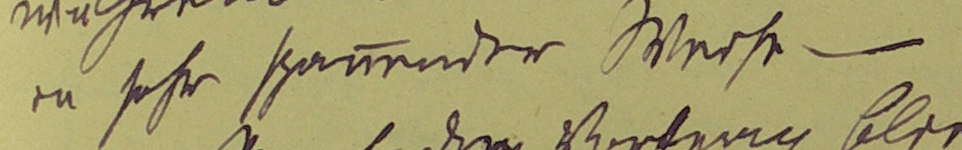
in sehr spannender Weise-
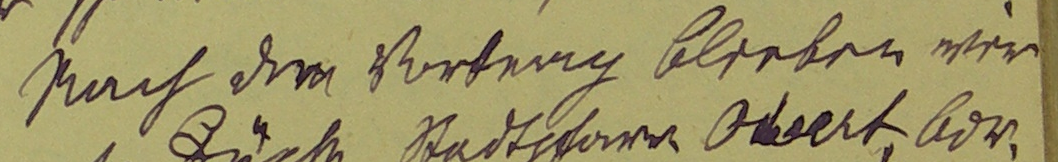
Nach dem Vortrag blieben wir
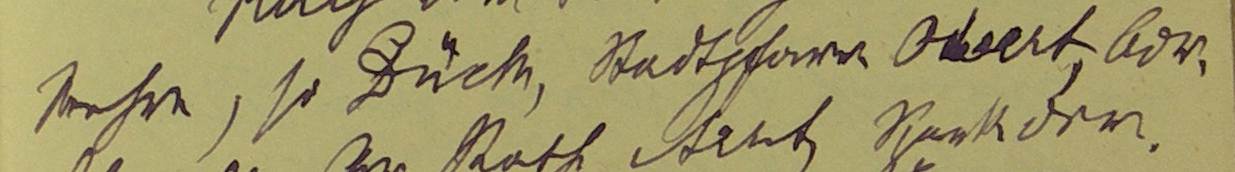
Sehre, so Dück, Stadtpfarrer Obert, Adv.
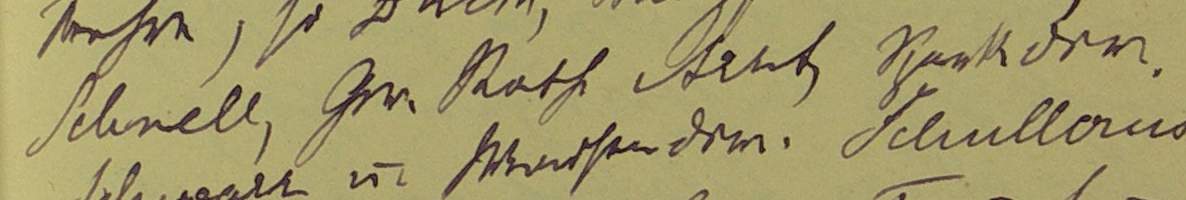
Schnell, Ger. Roth Arzt, Sparkdir.
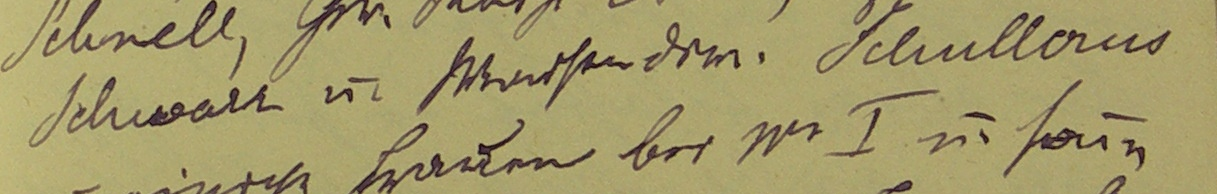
Schwarz und ?… Schullerus
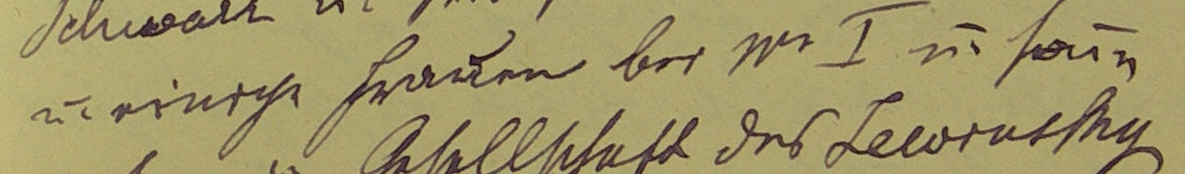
und einige Frauen bei W I und in
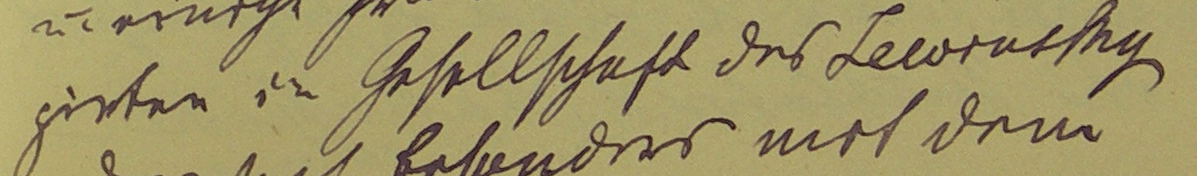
feierten in Gesellschaft des Lewinsky
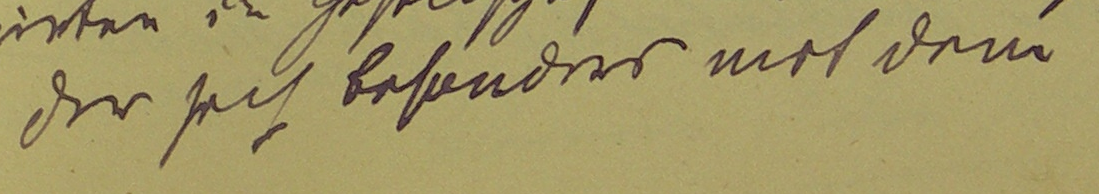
der sich besonders mit den
